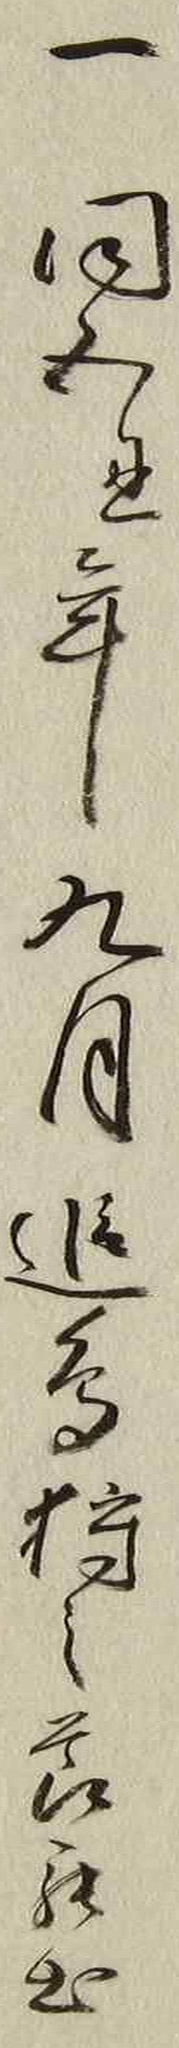一同五丑年九月追鳥狩之節罷出
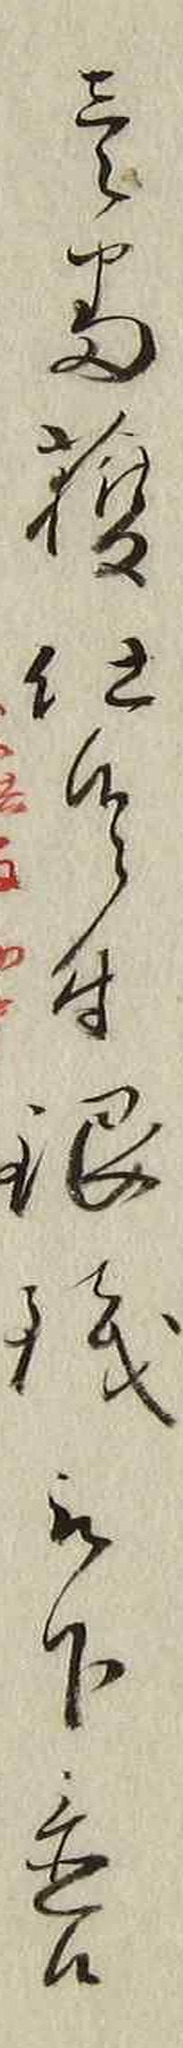壱番獲仕候に付銀銭被下置候
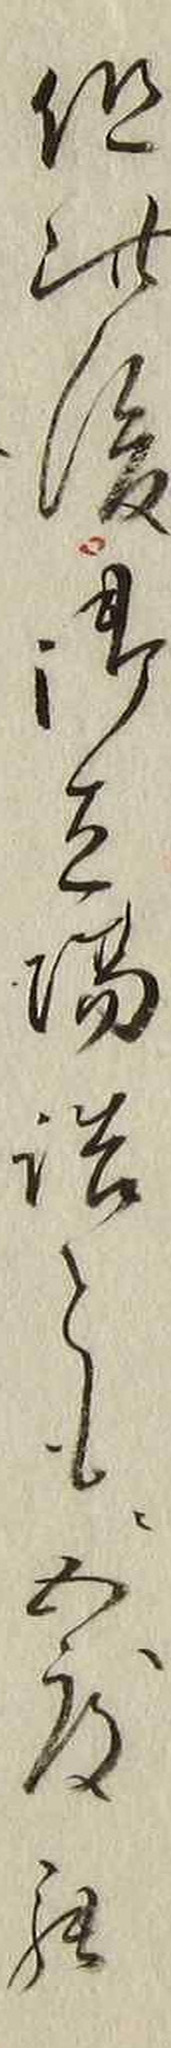但此後御立場詰ともに五度罷
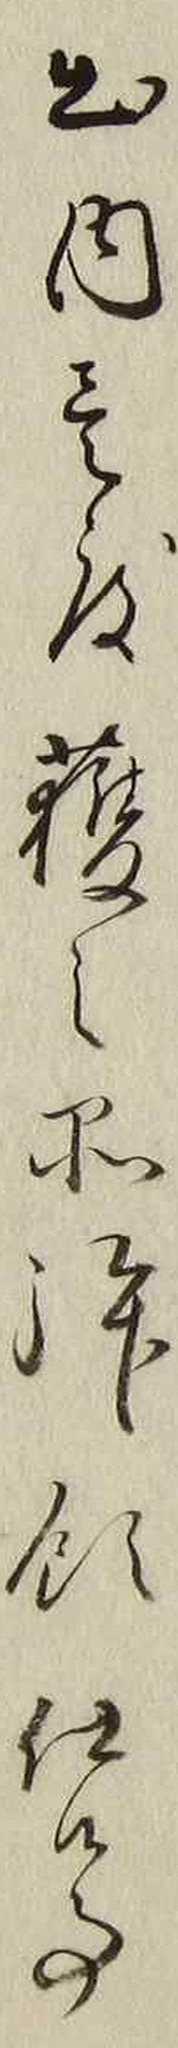出内壱度獲之品拝領仕候事
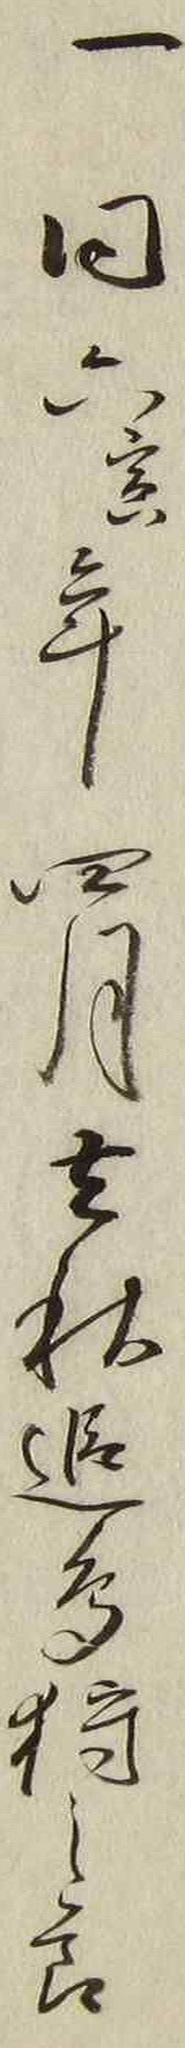一同六寅年四月去秋追鳥狩之節
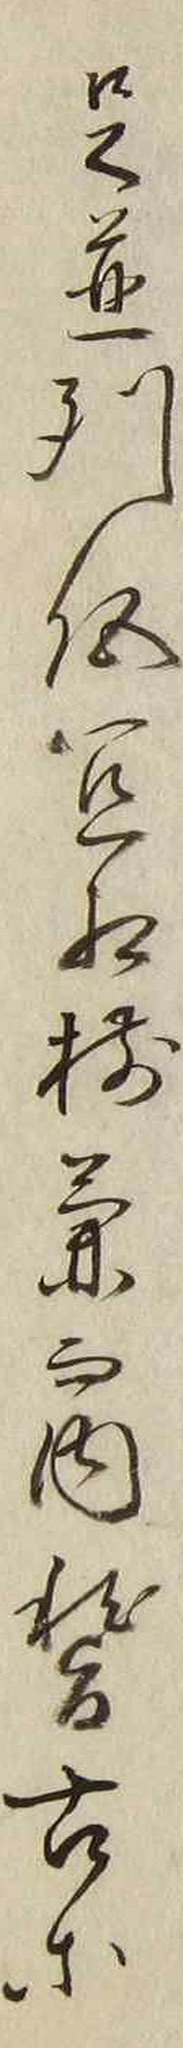足並列伍宜相揃兼而内稽古等

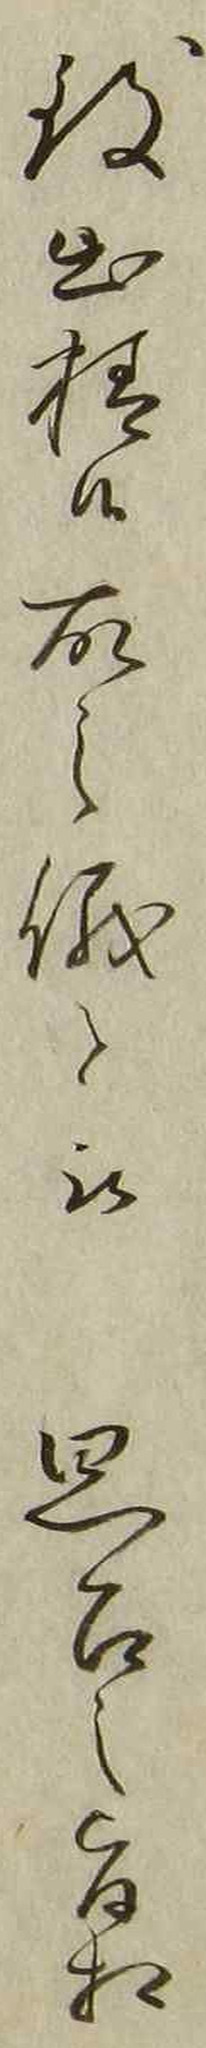致出精候故之儀と被思召之旨相
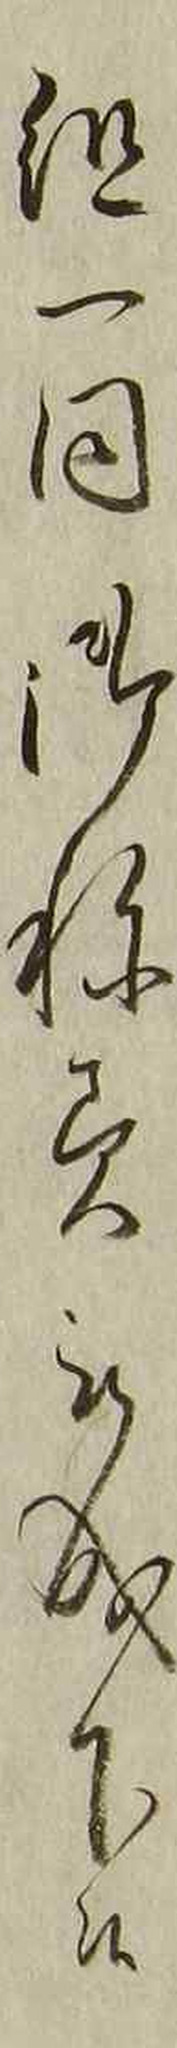組一同御称美被成下候
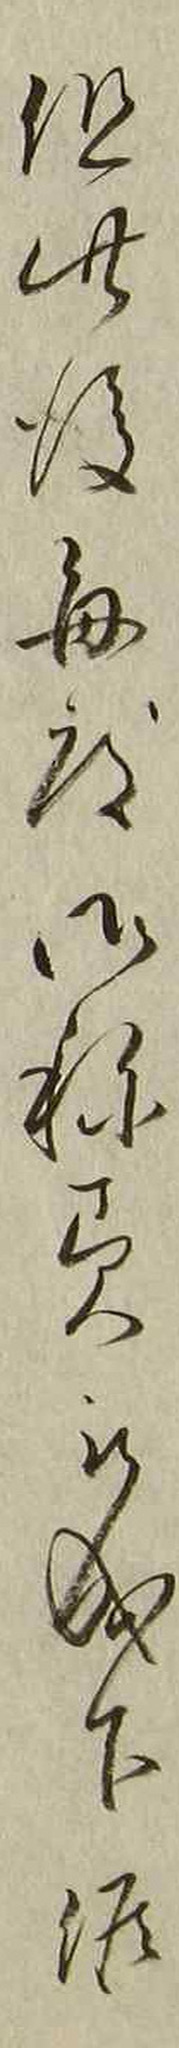但此後毎度御称美被成下候
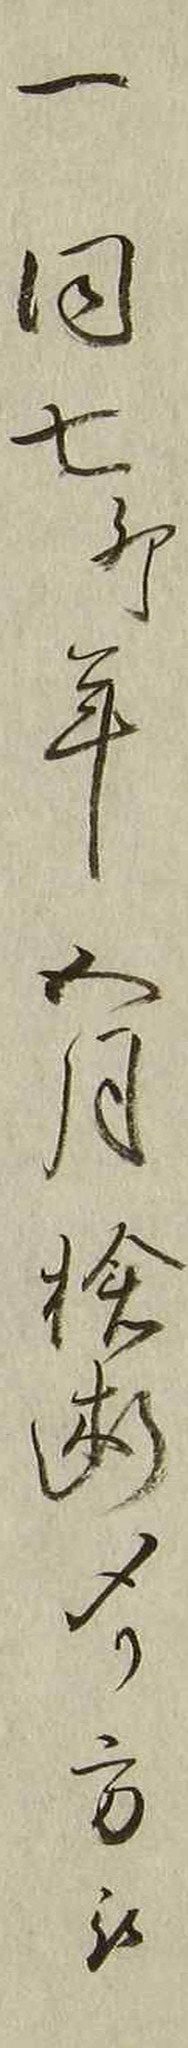一同七卯年五月槍術〆り方被
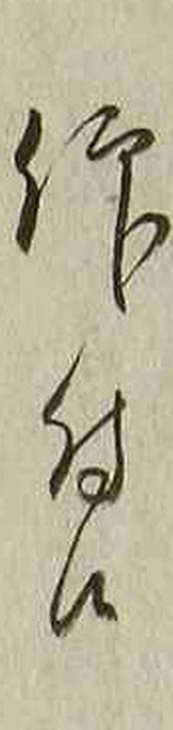仰付候
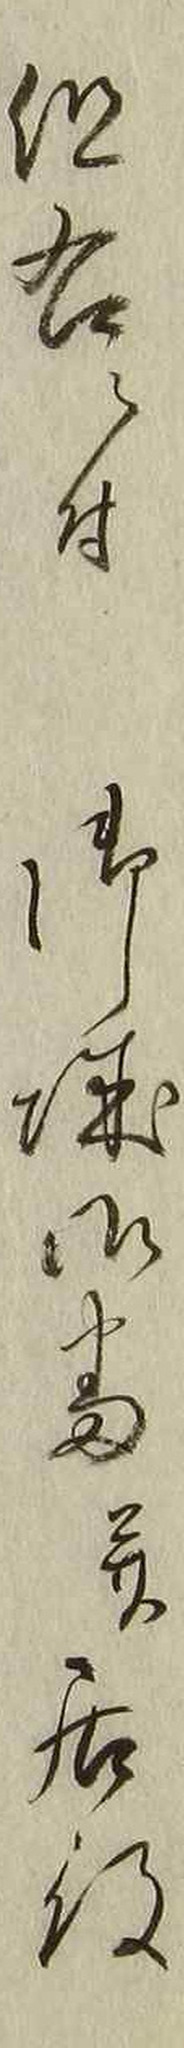但右に付御城御番幷居役
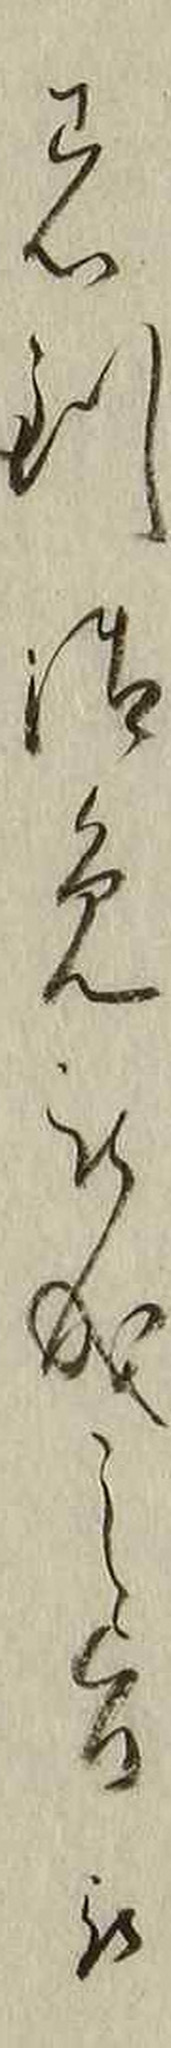着到御免被成之旨被
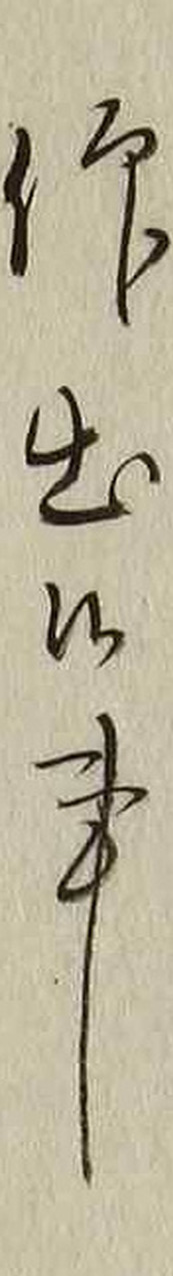仰出候事
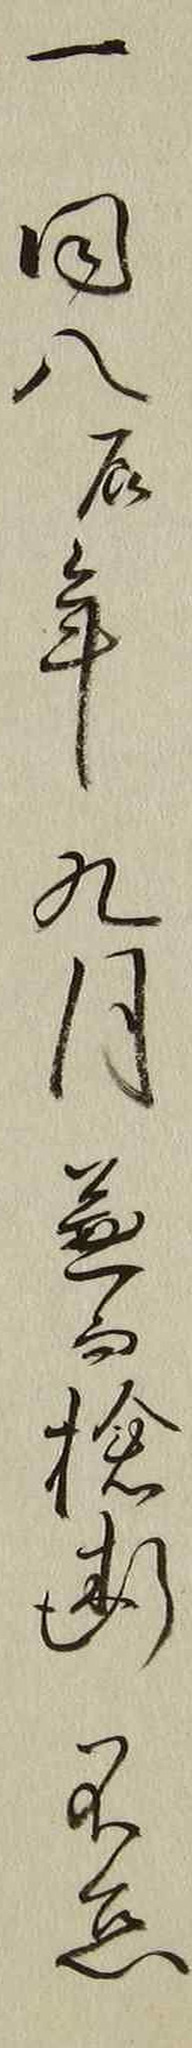一同八辰年九月兼而槍術不怠
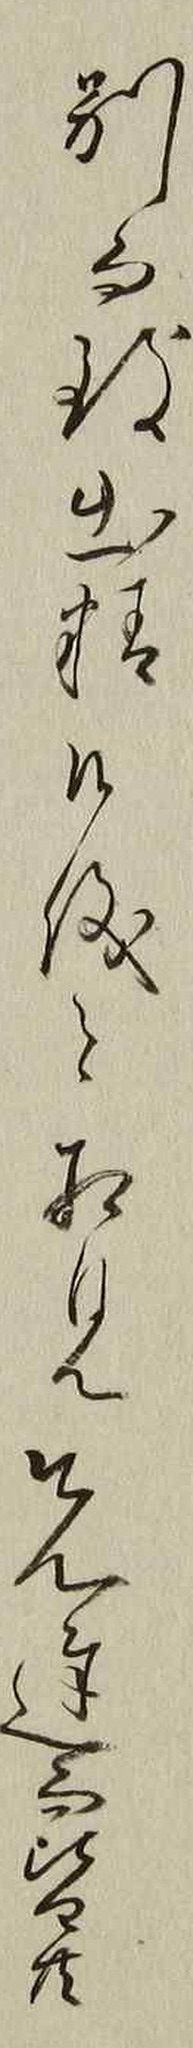別而致出精候儀と相見先達而皆共
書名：諸士系譜　巻之6　い之部6
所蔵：会津若松市立会津図書館
